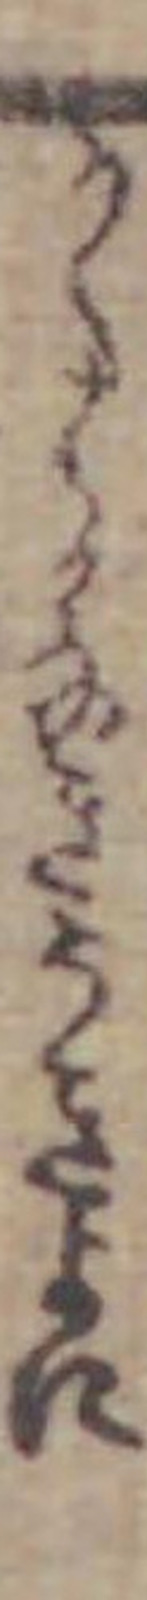かくはかなきうきよに
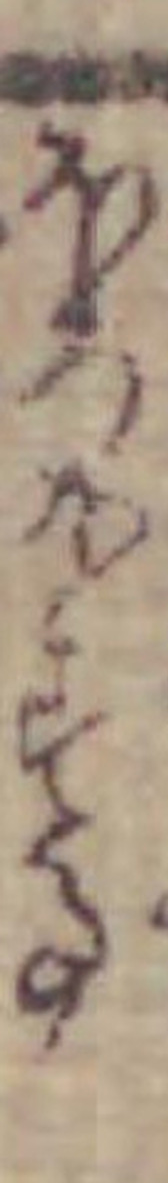ほろほす事
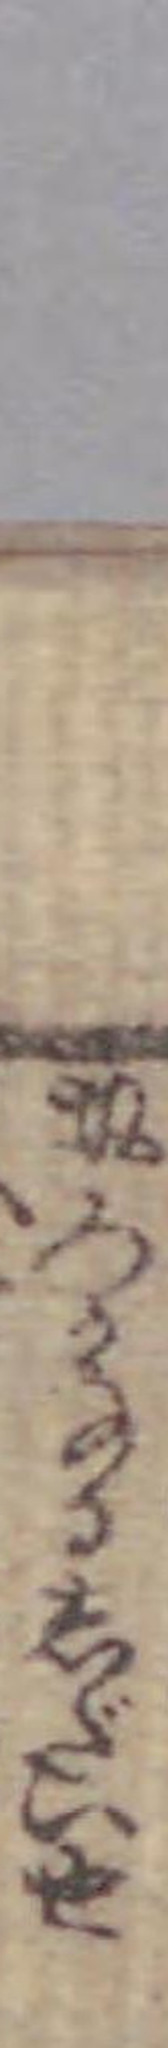おろかなるしだい也
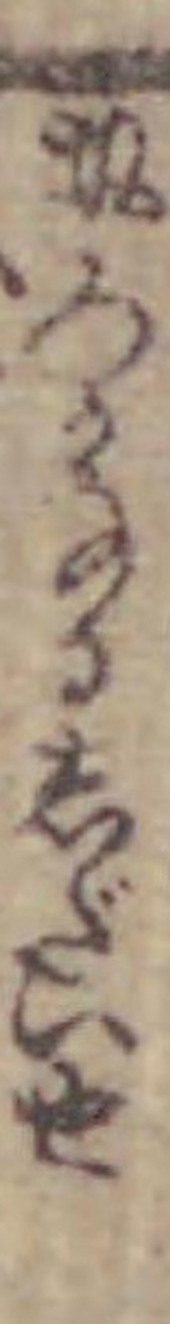おろかなるしだい也
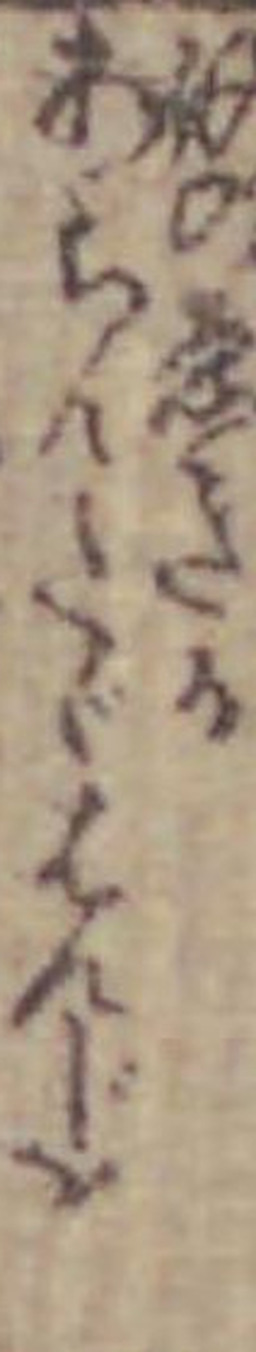あらんたゞはんじを
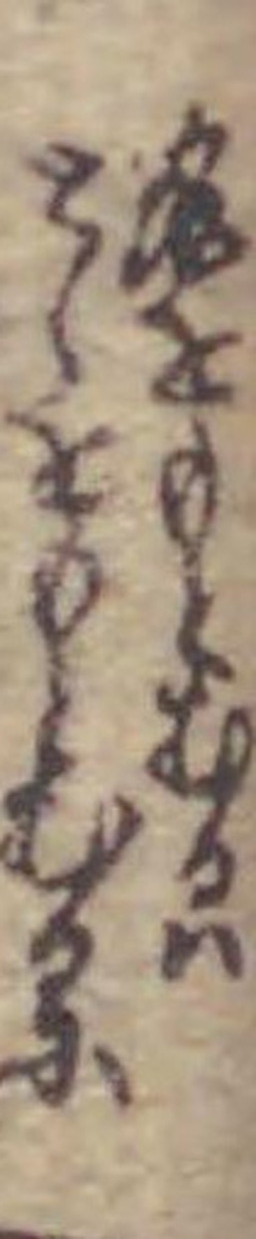とくをもとむるに
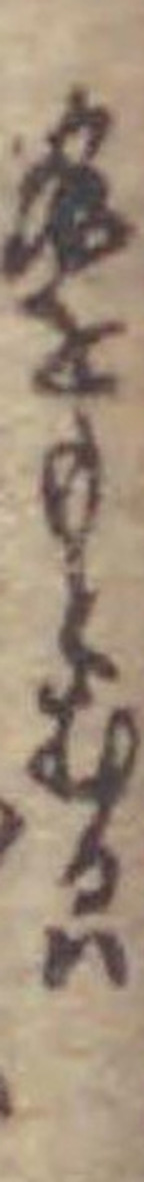名をもとむるは
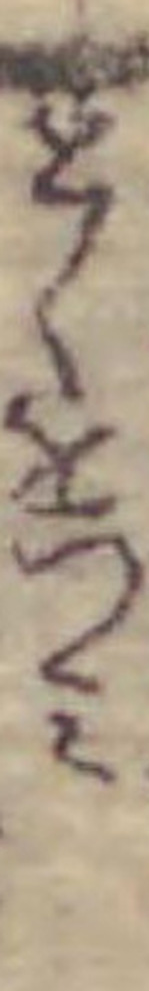とくをつみ
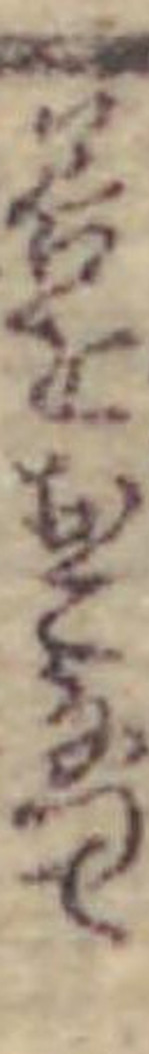善をおこなつて
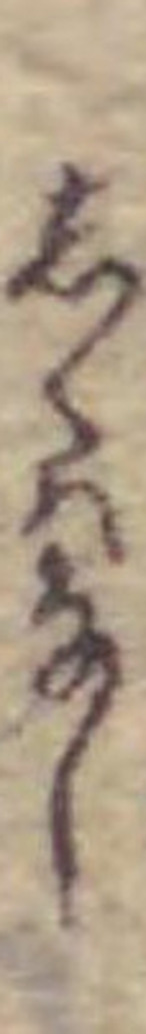しくはなし
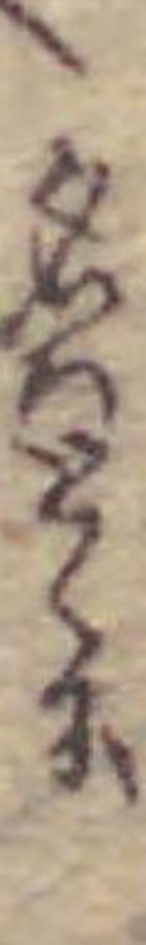名はとくに
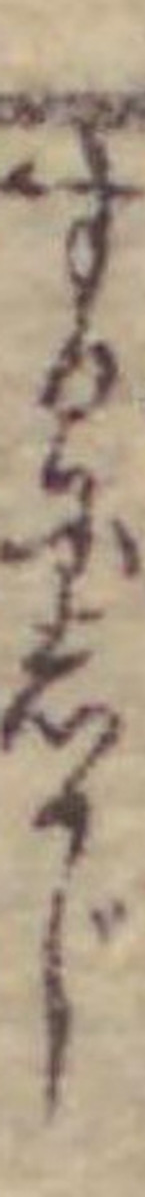するにしかじ
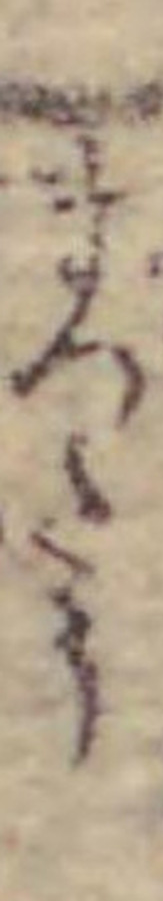まつたう
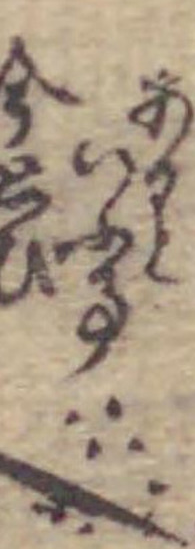今思ひ
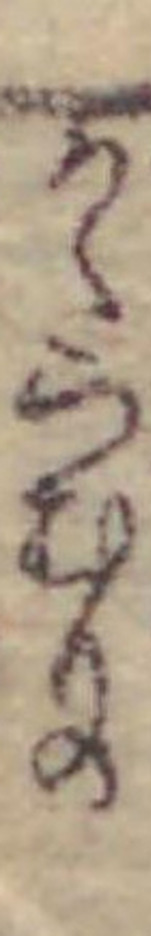かたつむりの
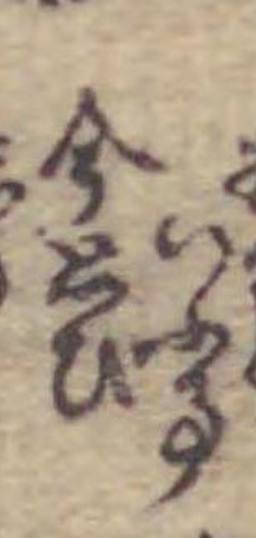今思ひ
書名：和荘兵衛後日話 : 3巻
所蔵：国立国会図書館 National Diet Library, JAPAN
